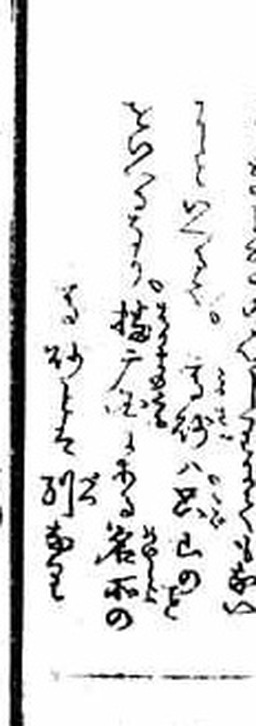いへるなり播磨国にある名所の
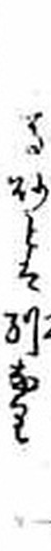高砂とは別なり
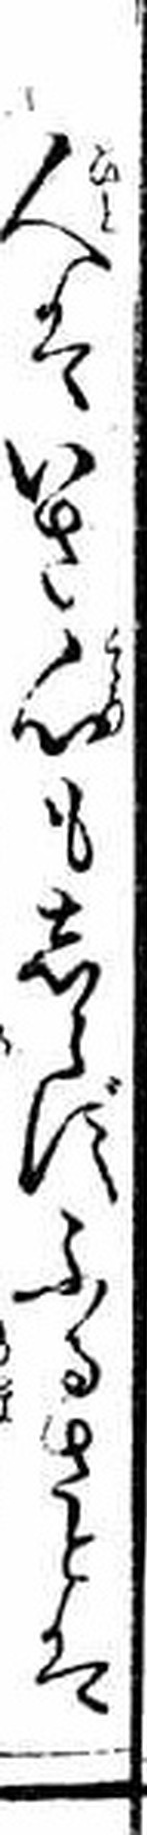人はいさ心もしらずふるさとは
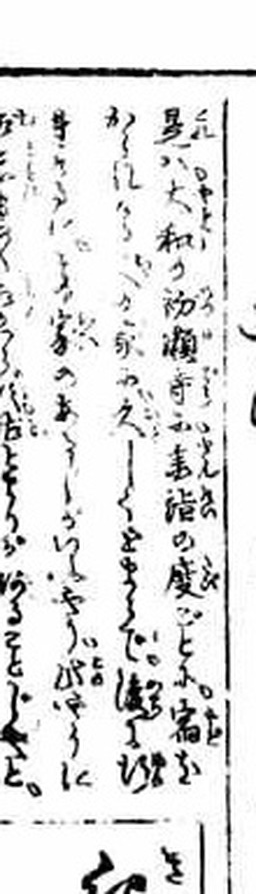かられける人の家に久しくとまらで後に行紀
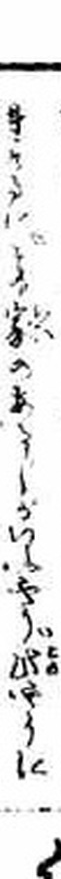きけるにその家のあるじがいふやう此やうに貫
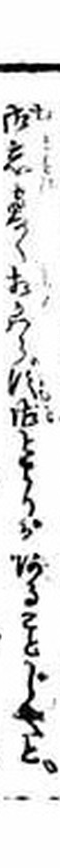もなく相かはらずとまりがあることじやと之
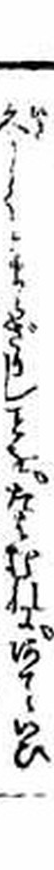久しくとまらざりしをたはむれにあてゝいひ
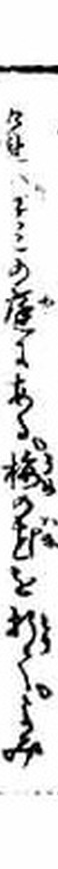ければそこの庭にある梅の花を折てよみ
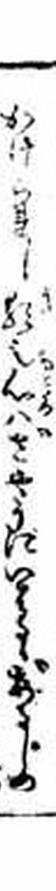かけられし歌也心はさやうにいはるゝあるじの
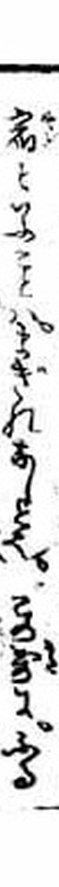宿といふことはまぎれなしと也この哥はふる
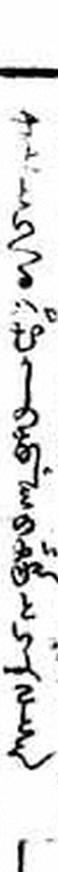さとといへるはむかしのなじみの家といふこと也

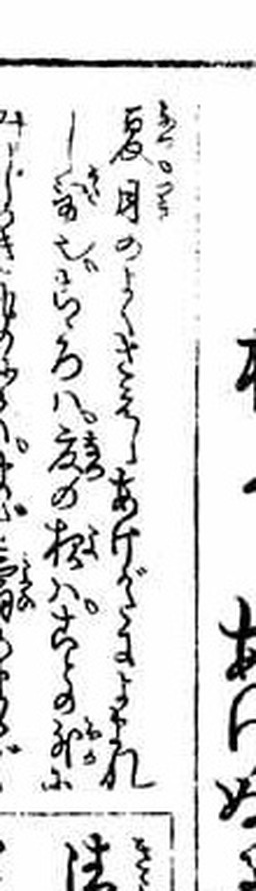夏月のよくさえしあけがたによまれ
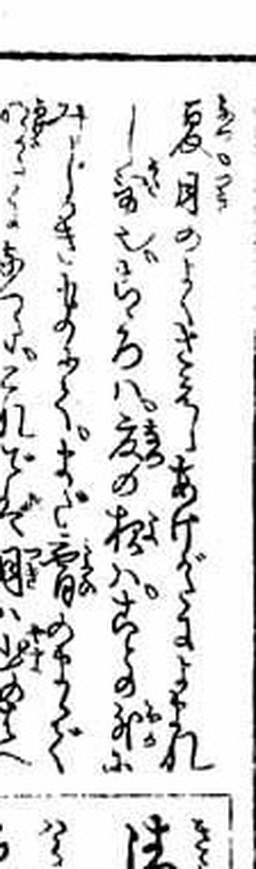し哥也こゝろは夏の夜はことの外に清
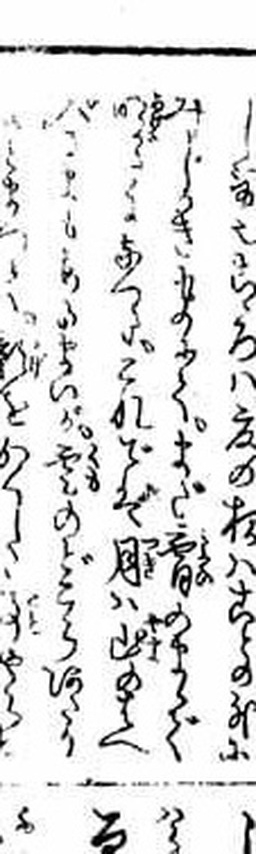明かたになつたこれでぞ月は山のはへ原
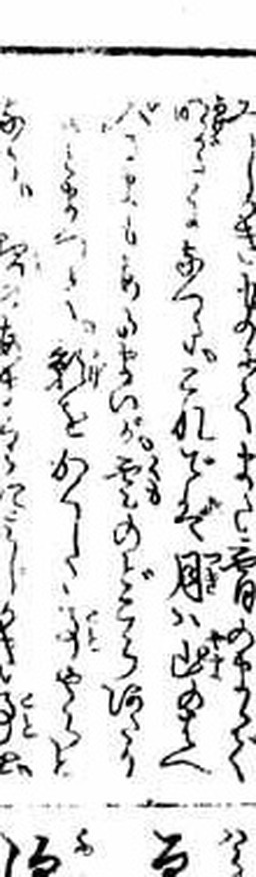入るまもあるまいが雲のどこらあたり
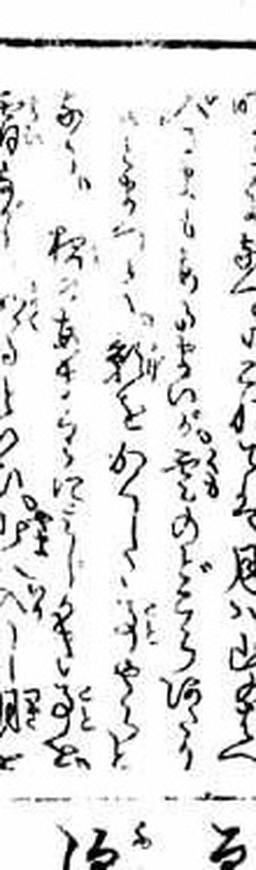とまつて影をかくした事やらと深
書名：小倉百人一首
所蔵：東京学芸大学教育コンテンツアーカイブ
